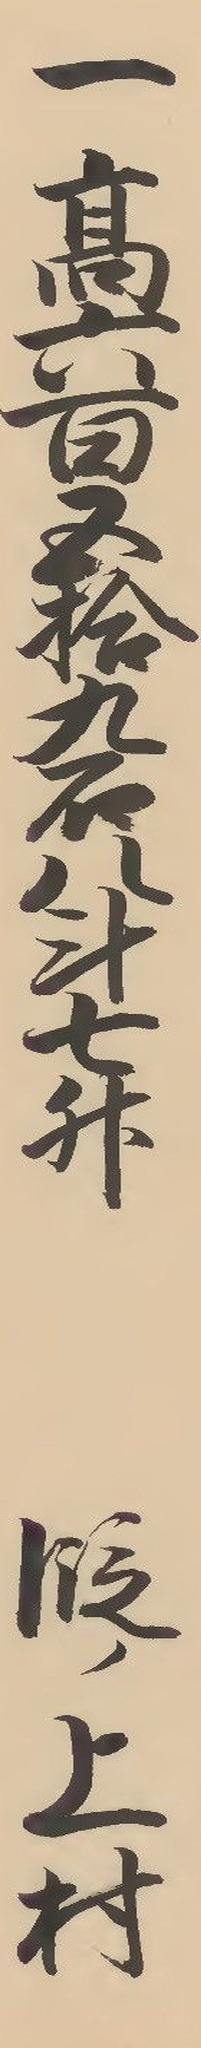一髙六百五拾九石八斗七升段ノ上村

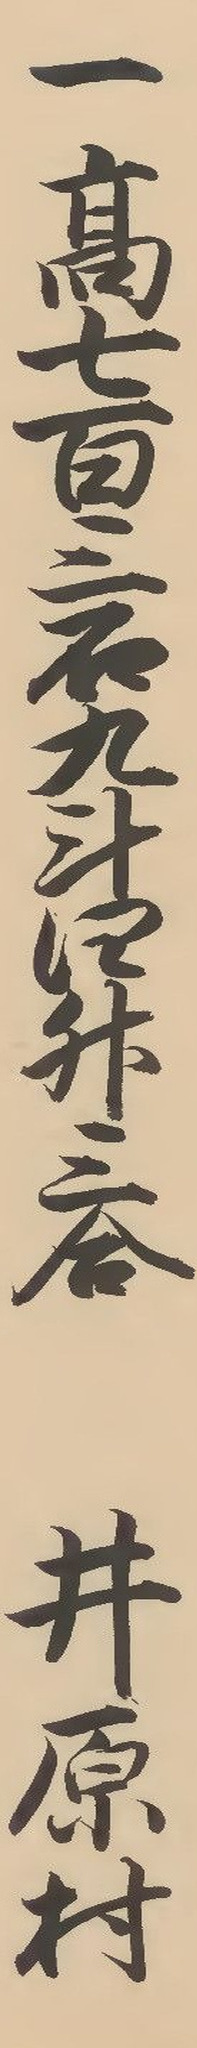一髙七百三石九斗四升三合井原村
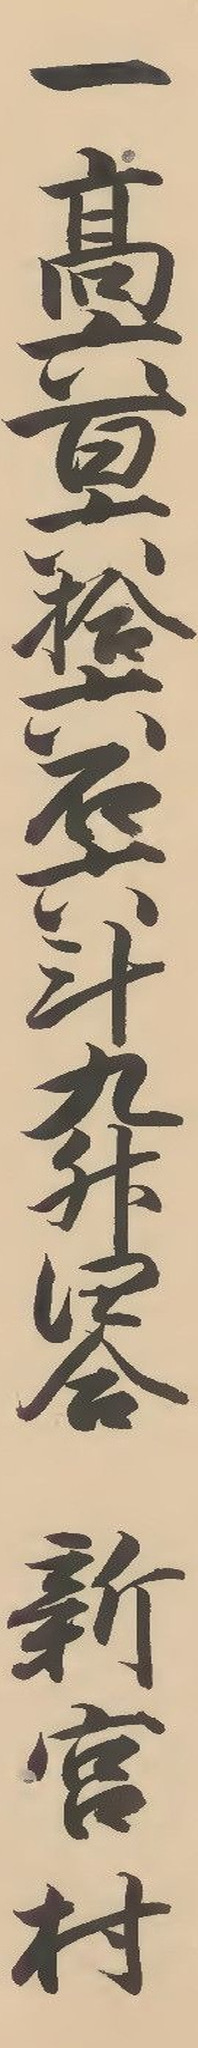一髙六百六拾六石六斗九升四合新宮村
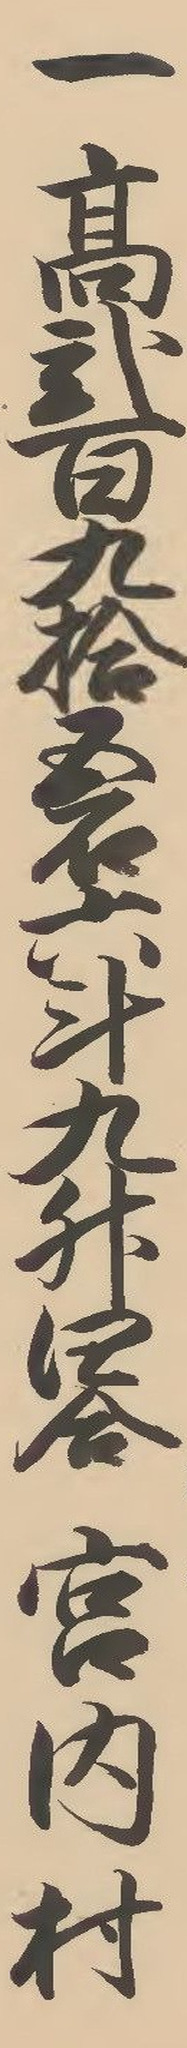一髙弐百九拾五石六斗九升四合宮内村
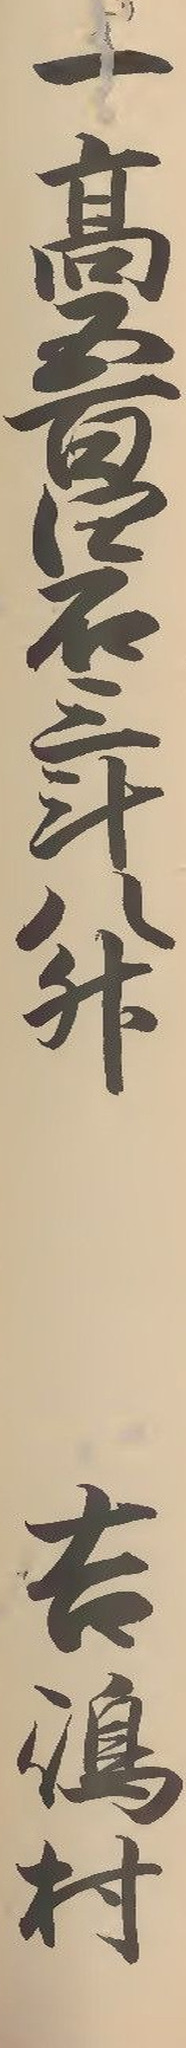一髙五百四石三斗八升吉嶋村
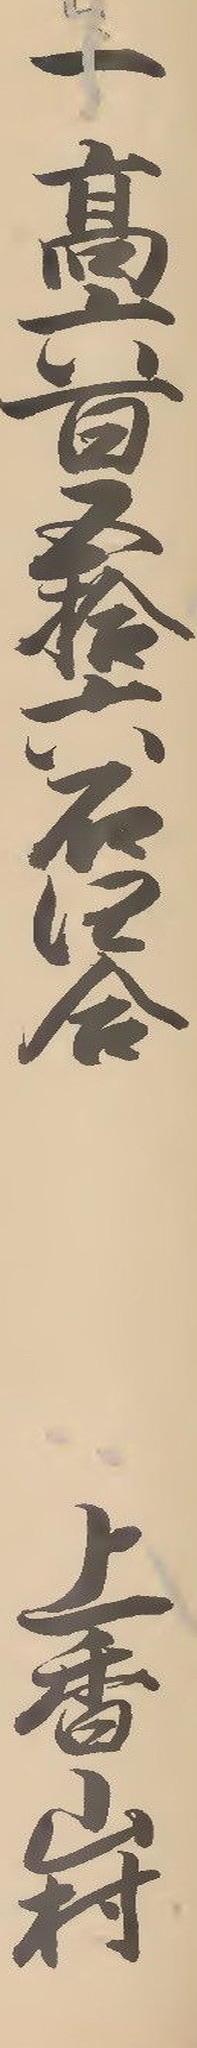一髙六百五拾六石四合上香山村
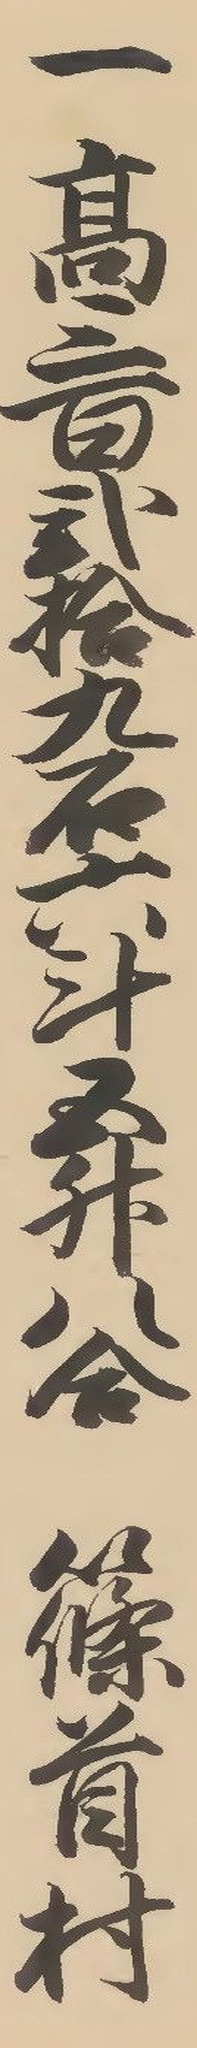一髙三百弐拾九石六斗五升八合篠首村
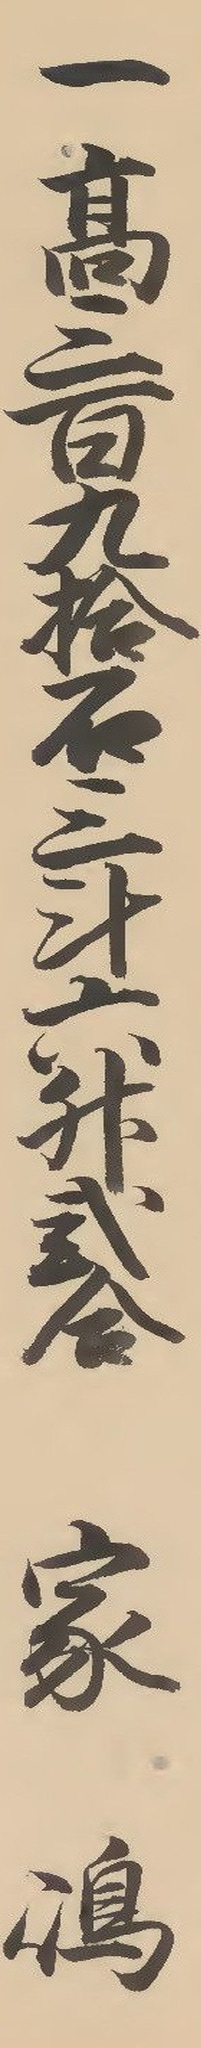一髙三百九拾石三斗六升弐合家嶋
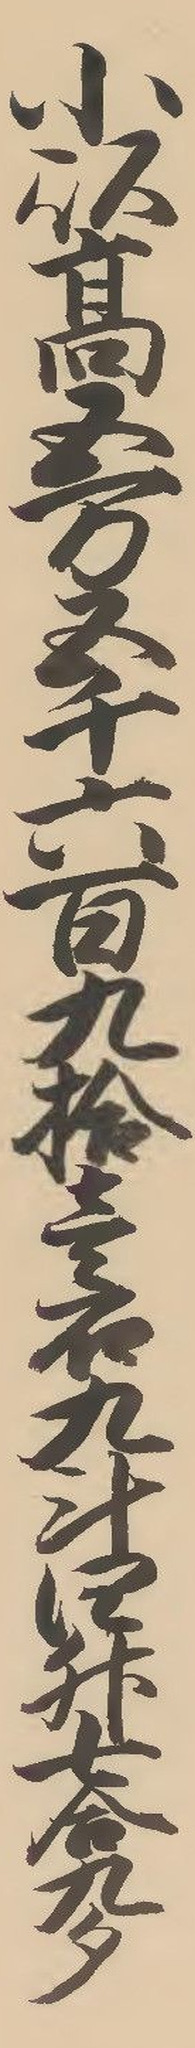小以髙五万五千六百九拾壱石九斗四升七合九夕

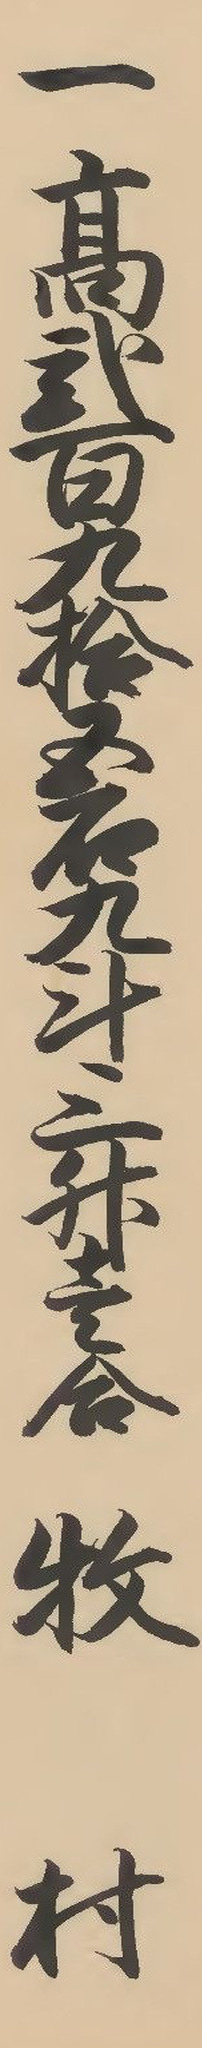一髙弐百九拾五石九斗弐升壱合牧村
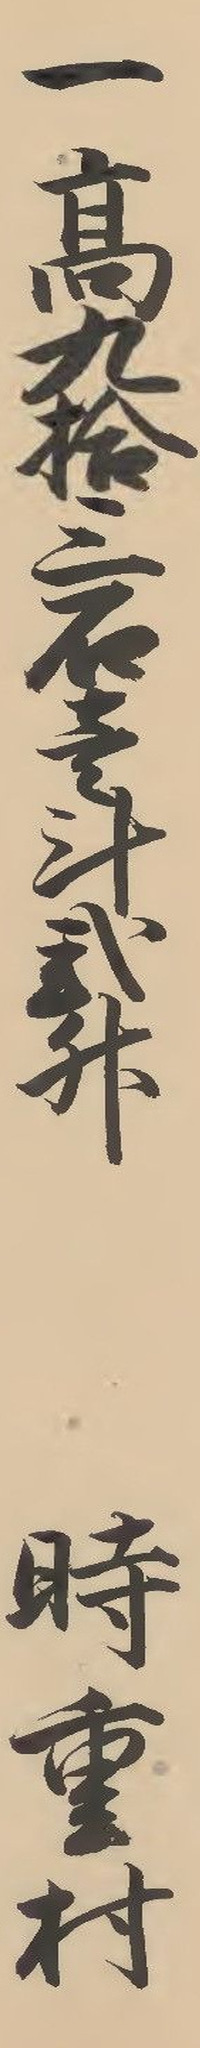一髙九拾三石壱斗弐升時重村
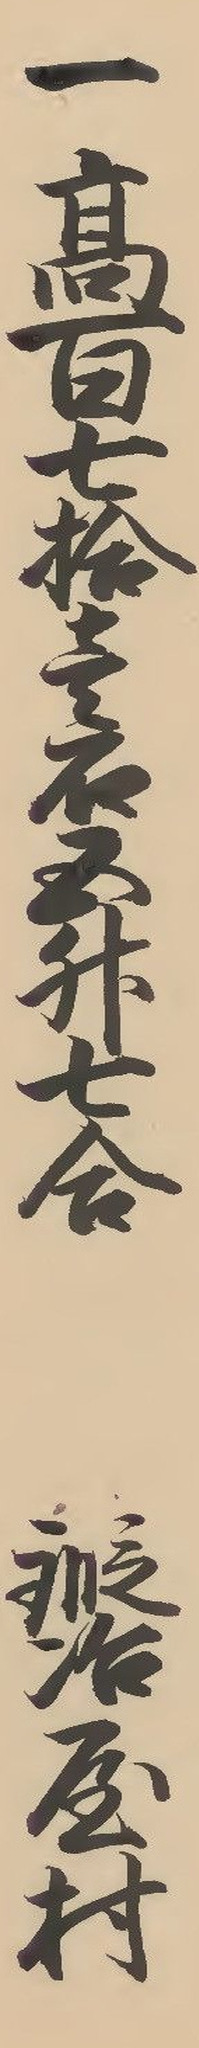一髙百七拾壱石五升七合鍛冶屋村

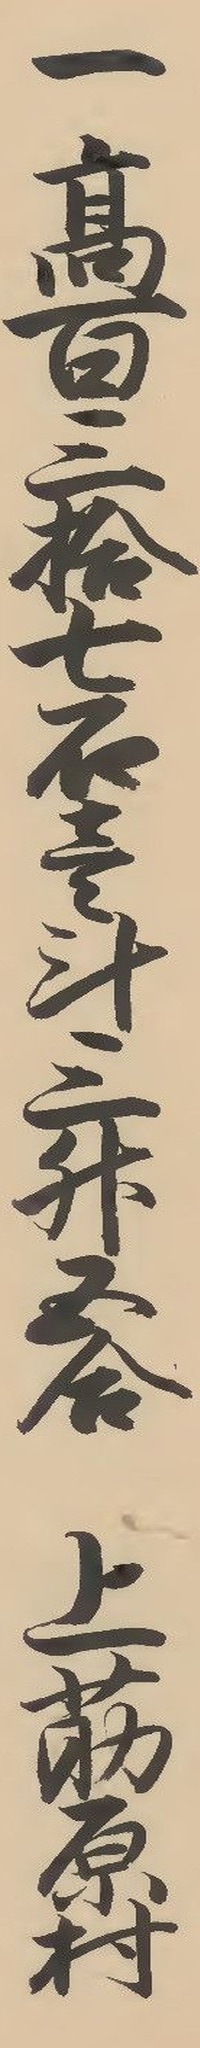一髙百三拾七石壱斗三升五合上原村
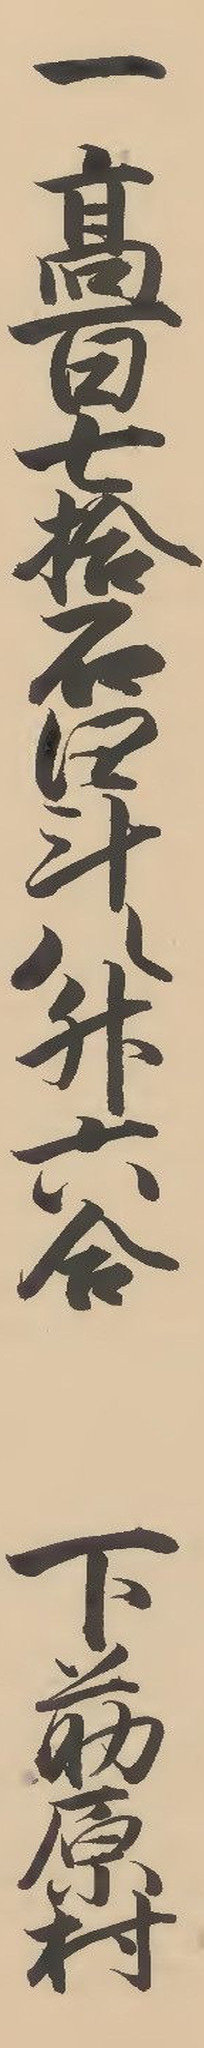一髙百七拾石四斗八升六合下原村
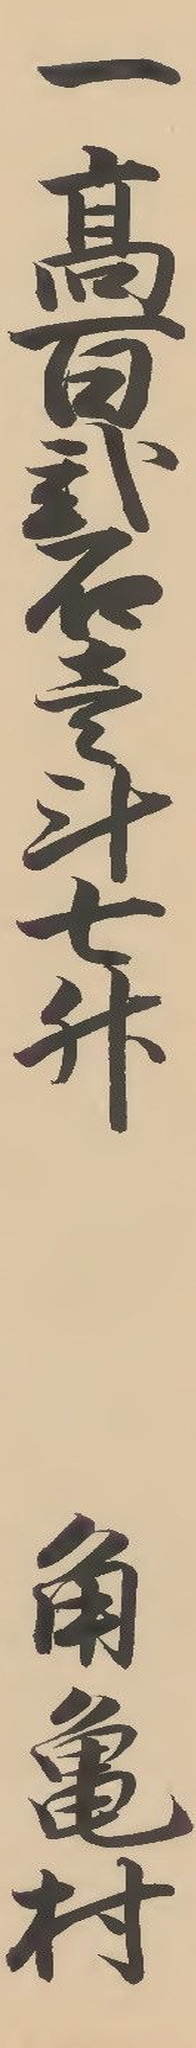一髙百弐石壱斗七升角亀村
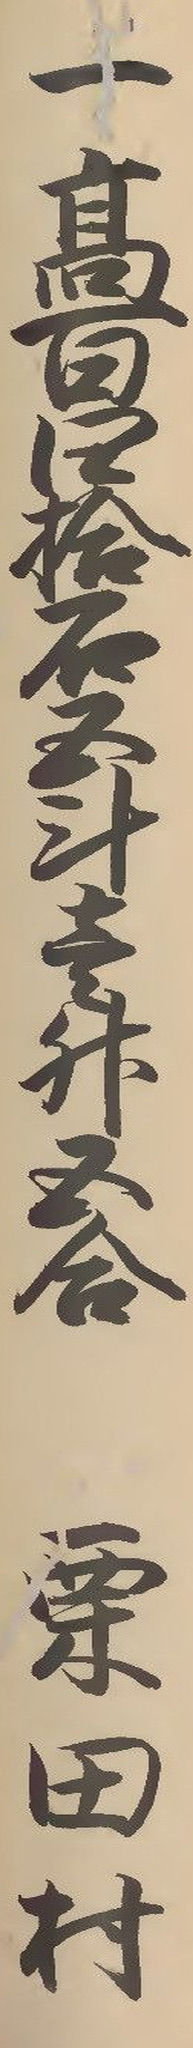一髙百四拾石五斗壱升五合栗田村
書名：播磨国郷帳
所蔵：国立公文書館 National Archives of Japan
